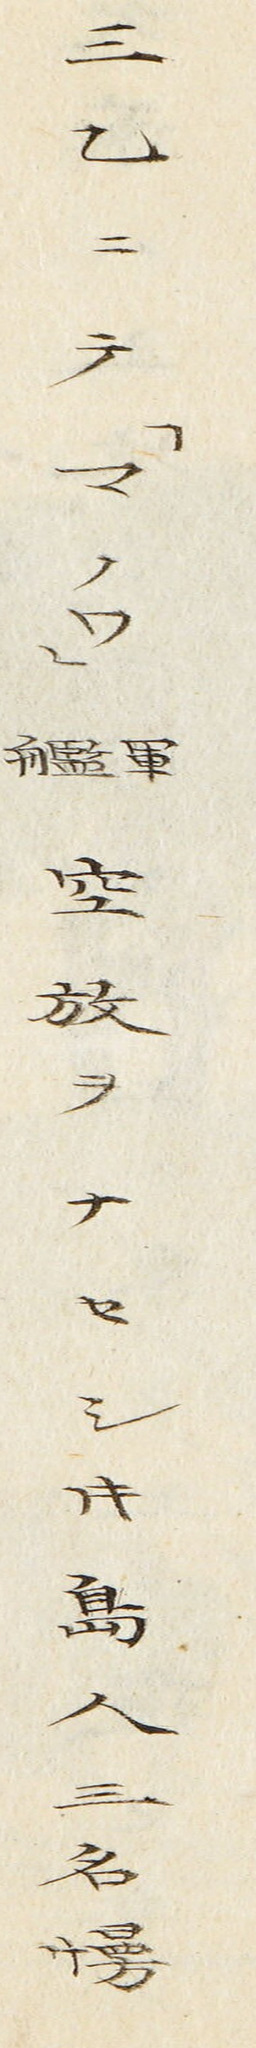三乙ニテ「マノワ」軍艦空放ヲナセシトキ島人三名慢
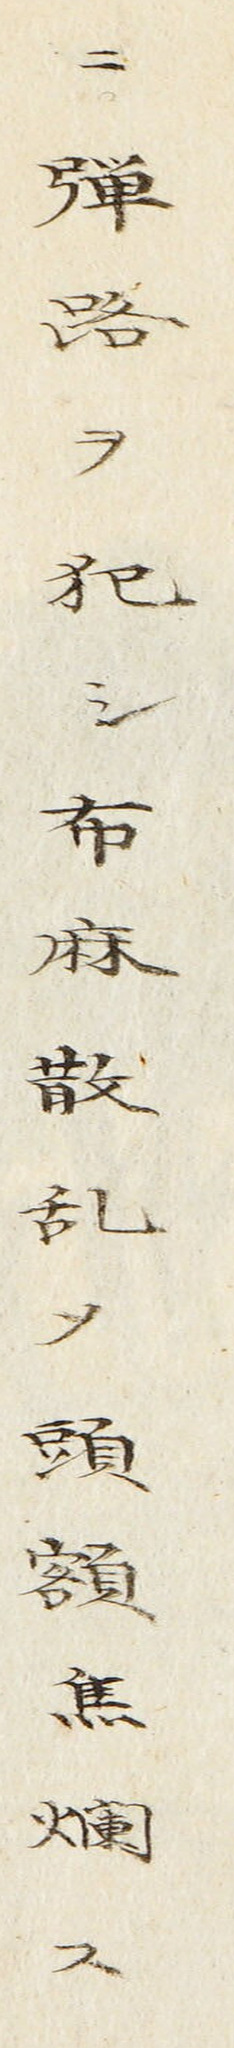ニ弾路ヲ犯シ布麻散乱シテ頭額焦爛ス
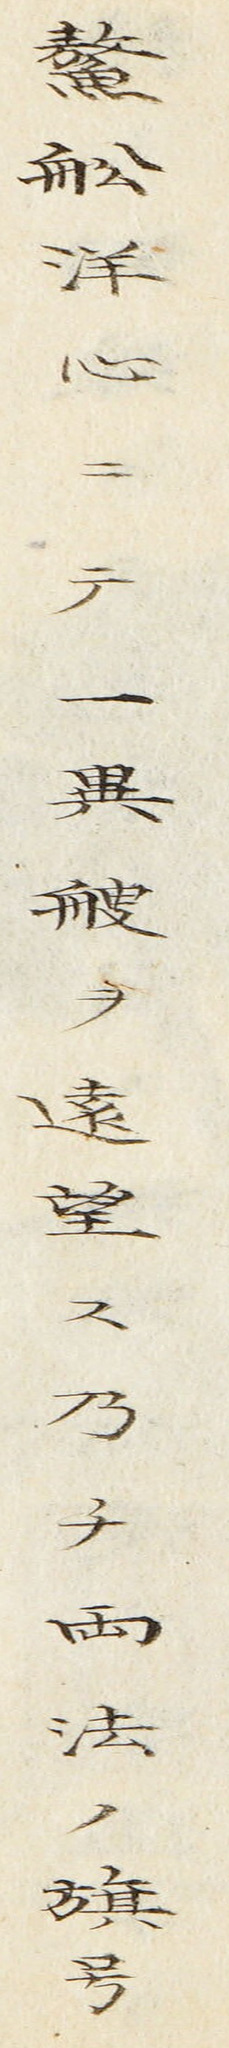〇鰲舩洋心ニテ一異艘ヲ遠望ス乃チ両法ノ旗号
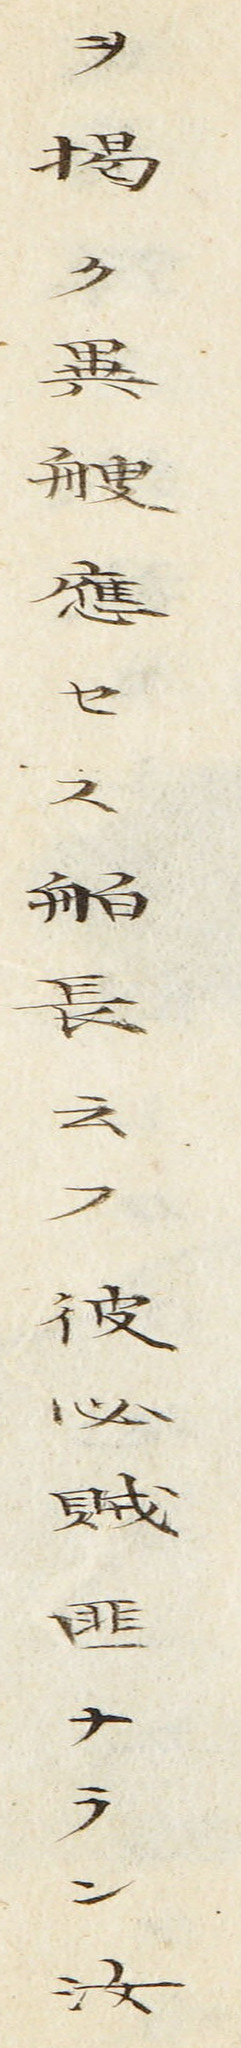ヲ掲ク異艘応セス舶長云フ彼必賊匪ナラン汝
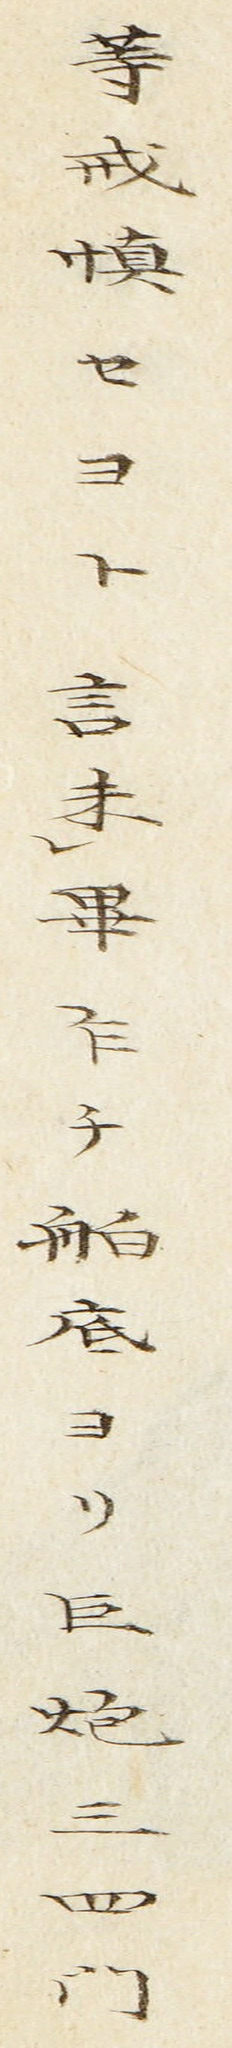等戒慎セヨト言未畢乍チ舶底ヨリ巨炮三四門
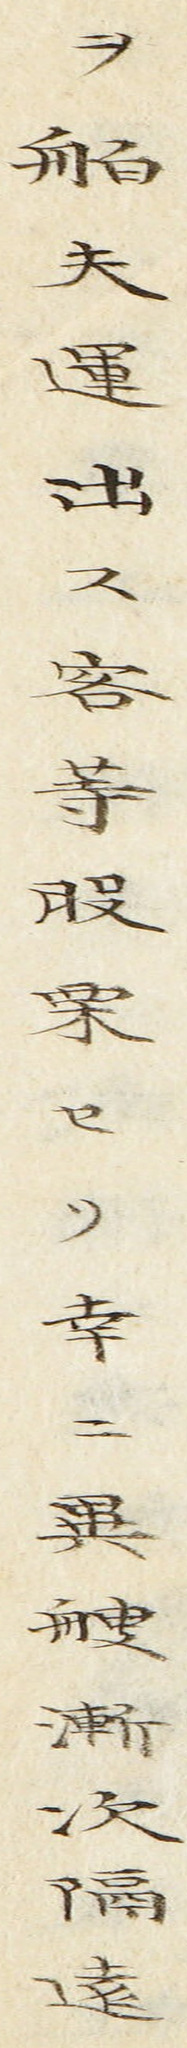ヲ舶夫運出ス客等股栗セリ幸ニ異艘漸次隔遠

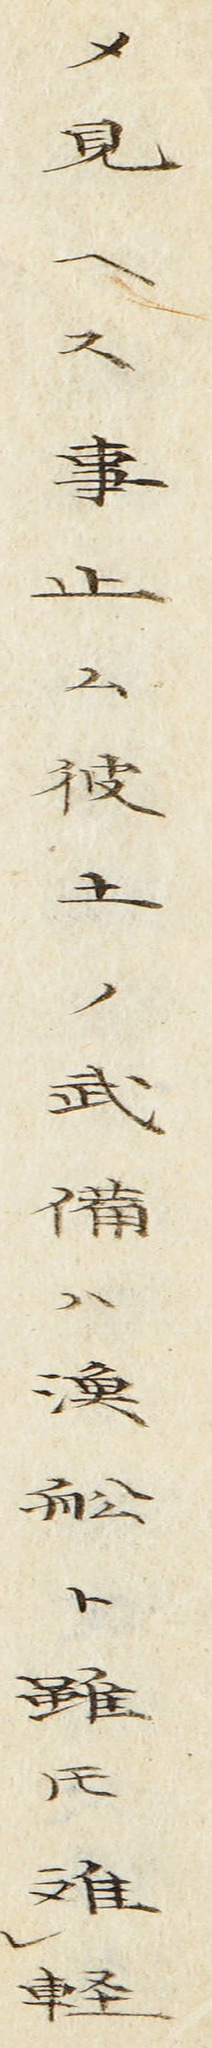シテ見ヘス事止ム彼土ノ武備ハ漁舩ト雖トモ難軽
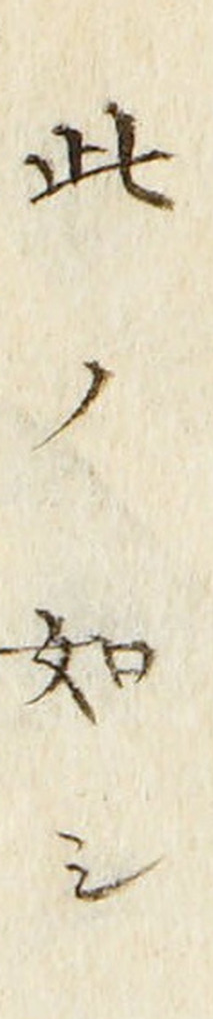此ノ如シ
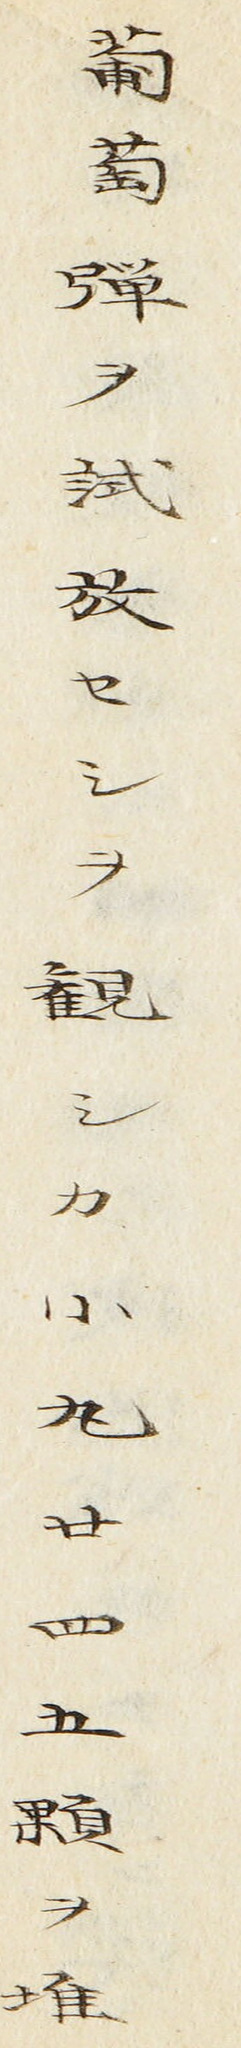〇葡萄弾ヲ試放セシヲ観シカ小丸廿四五顆ヲ堆
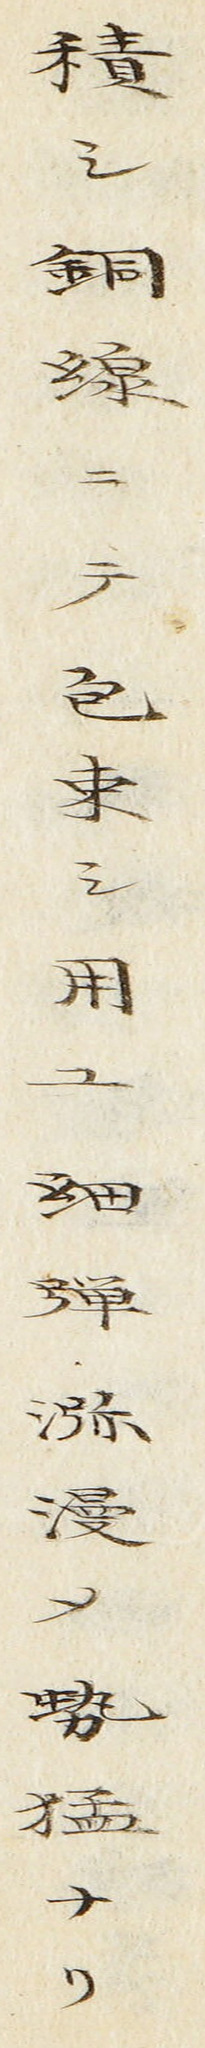積シ銅線ニテ包束シ用ユ細弾瀰漫シテ勢猛ナリ
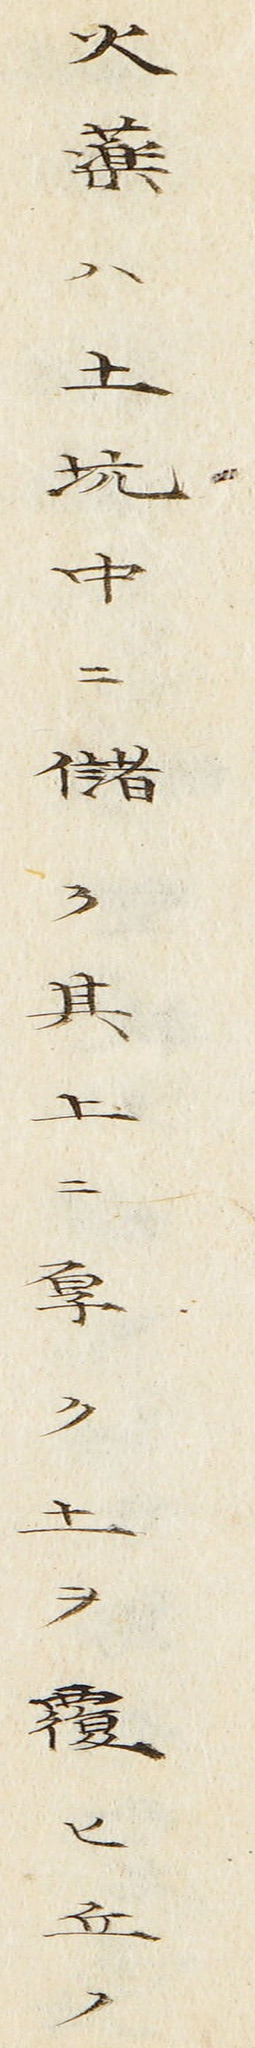〇火薬ハ土坑中ニ儲ク其上ニ厚ク土ヲ覆ヒ丘ノ
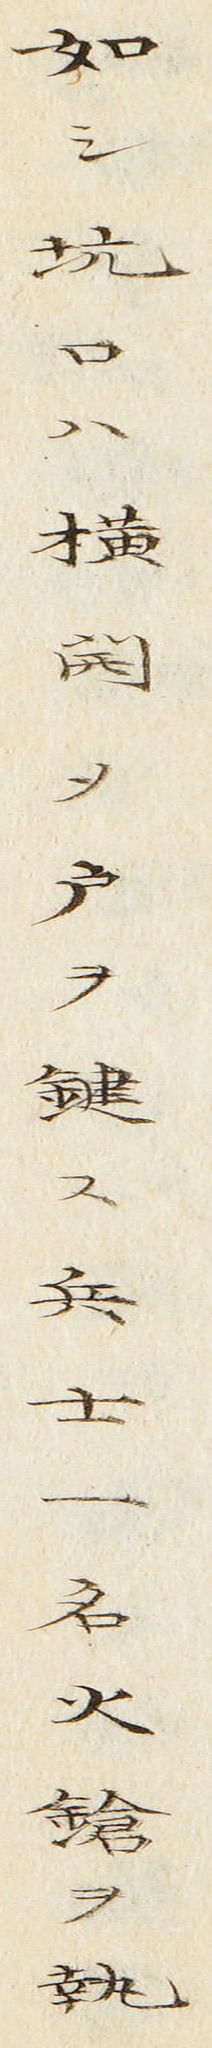如シ坑口ハ横開シテ戸ヲ鍵ス兵士一名火鎗ヲ執
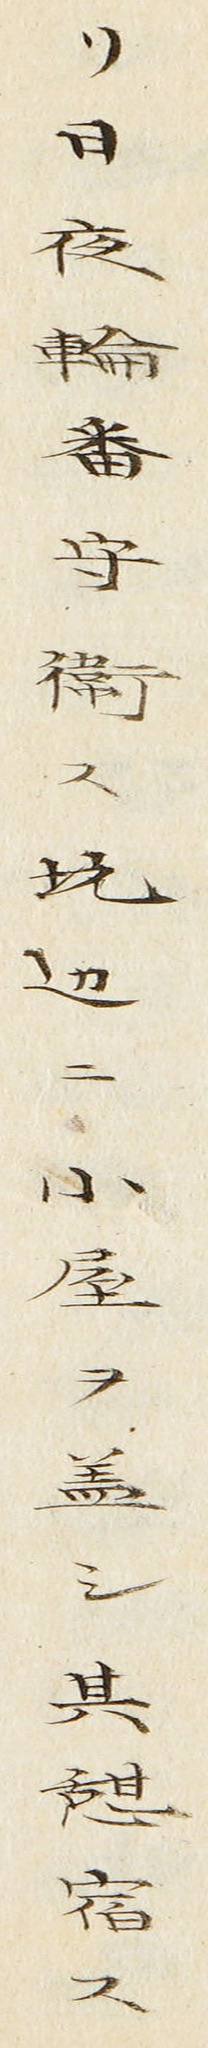リ日夜輪番守衛ス坑辺ニ小屋ヲ蓋シ其憩宿ス
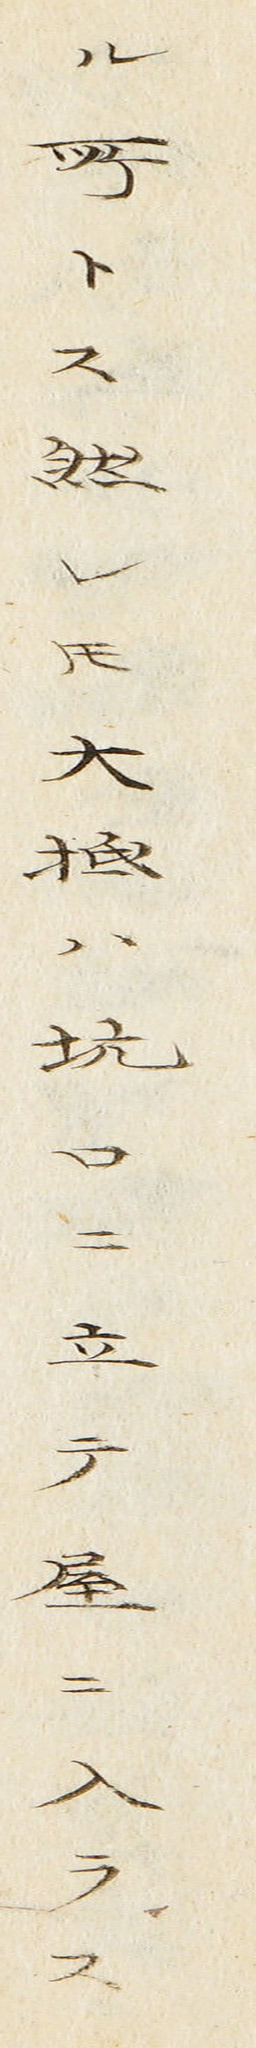ル所トス然レトモ大抵ハ坑口ニ立テ屋ニ入ラス
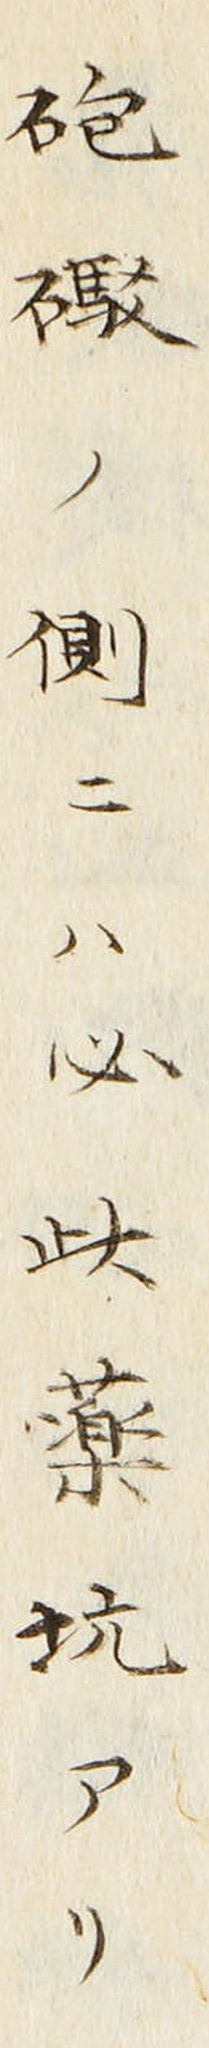砲礟ノ側ニハ必此薬坑アリ
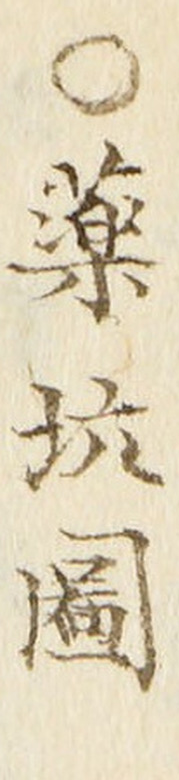〇薬坑図
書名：蕃談
